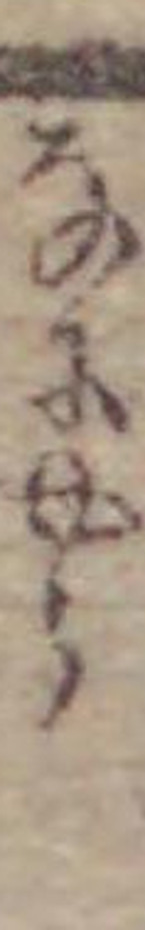なにやら
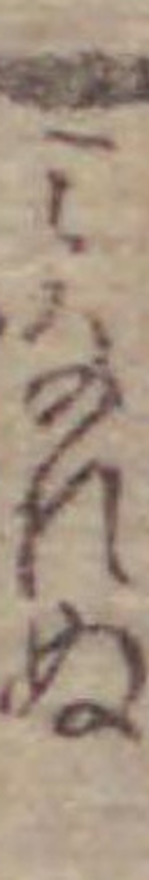みなれぬ
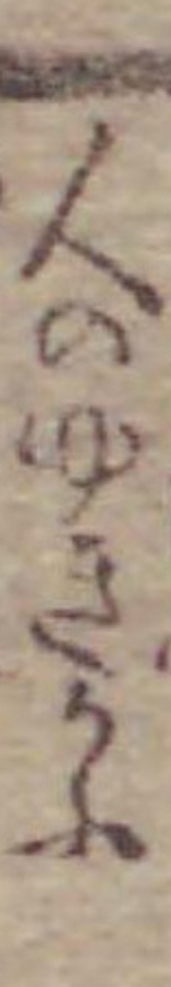人のゆきかふ
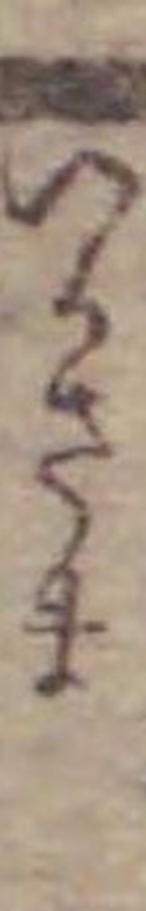いかさま
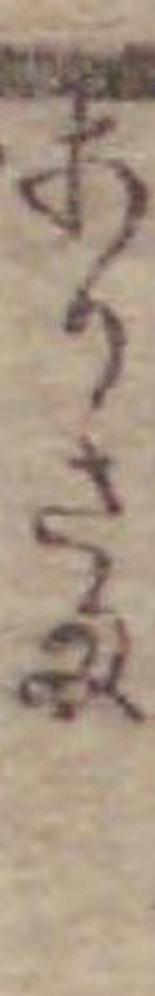ありさま
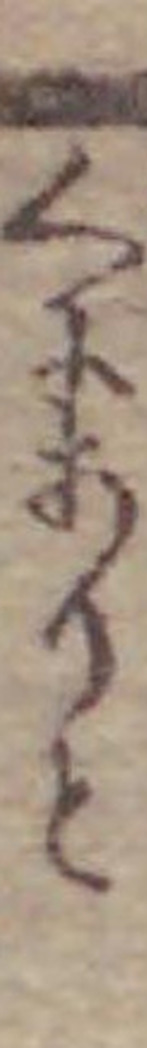くにありと
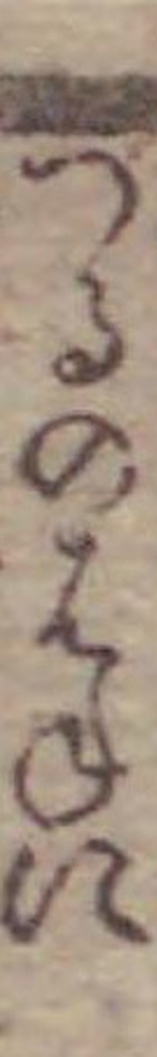つるのはねに
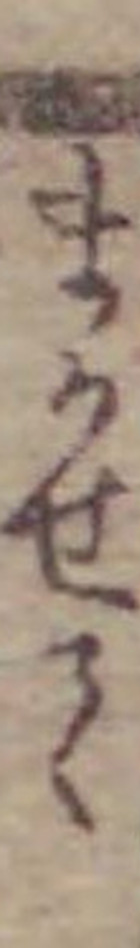まかせて
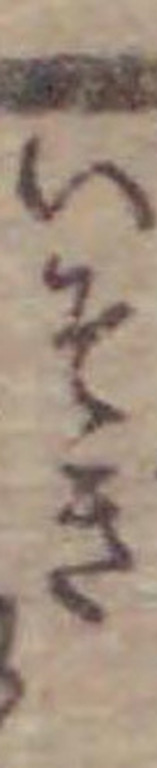いそき

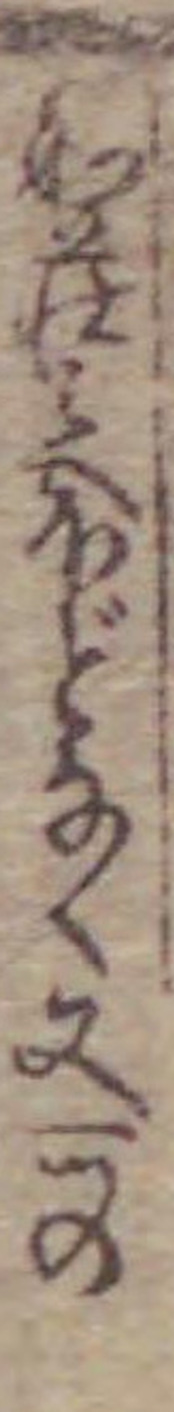和荘兵へほどなく又一つの
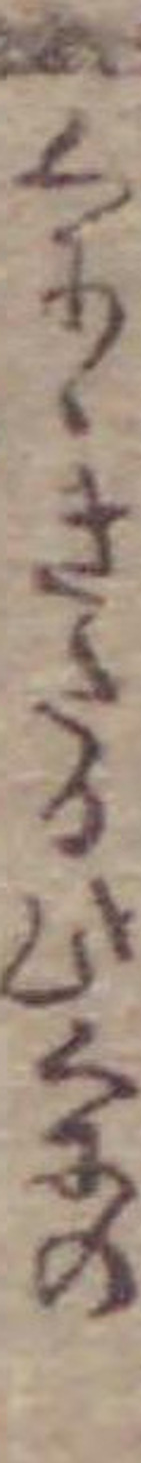くにゝきたる此くにの
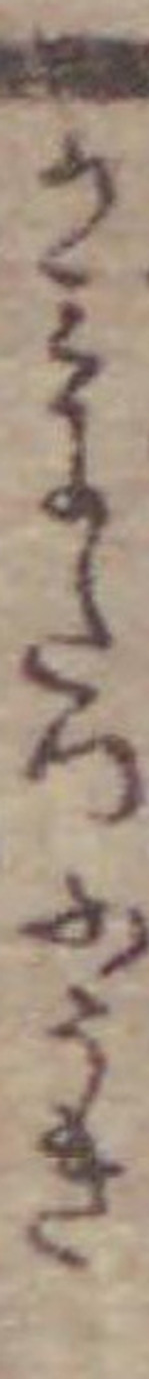かみにたつふうき
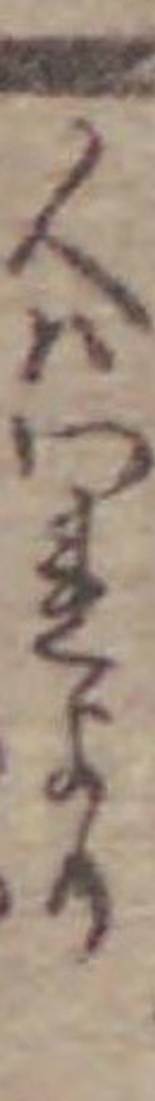人はわれより
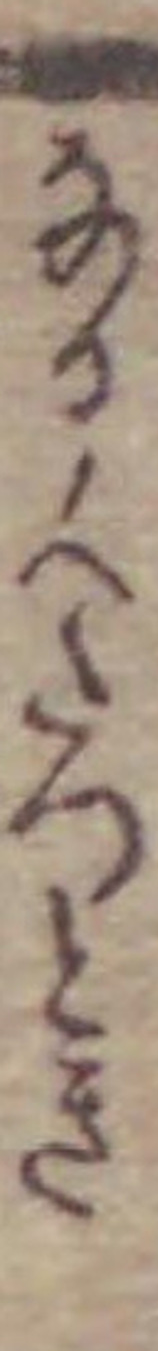なる人たつとき
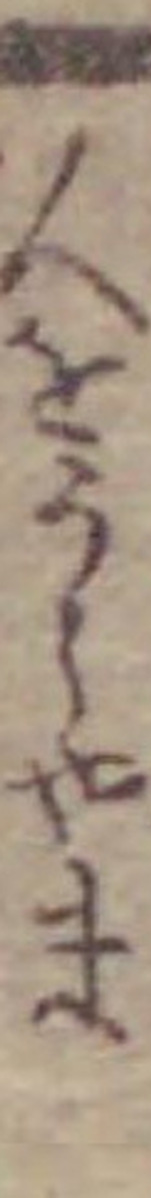人をうらやま
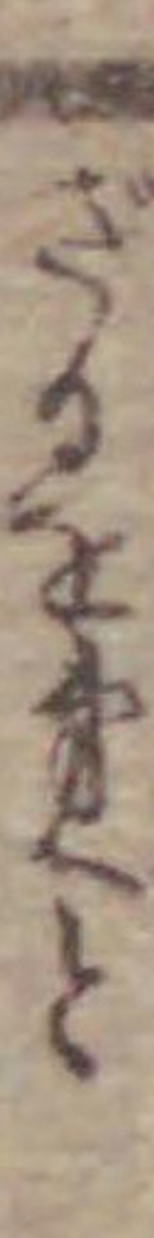ざるを第一と
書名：和荘兵衛後日話 : 3巻
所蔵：国立国会図書館 National Diet Library, JAPAN
